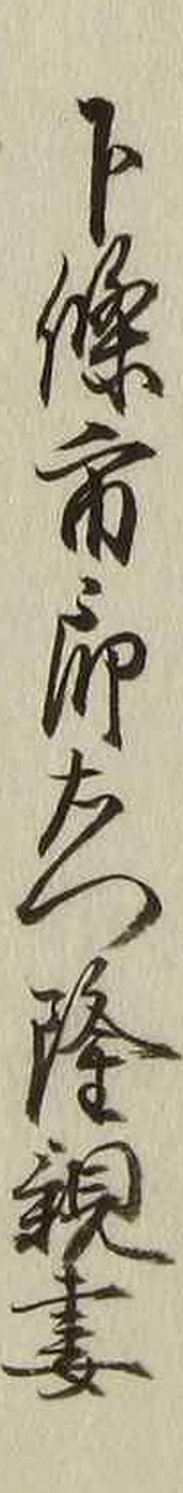女下条市郎右衛門隆親妻
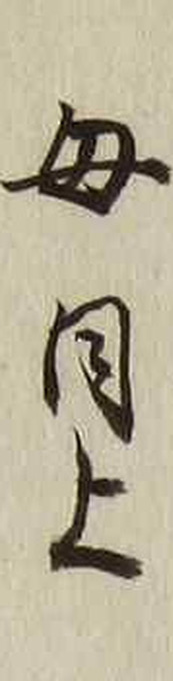母同上
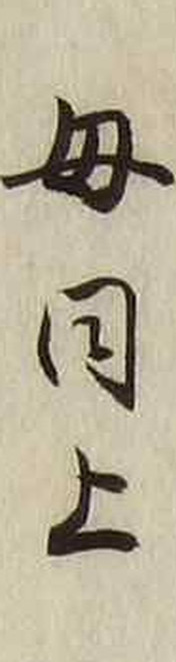母同上
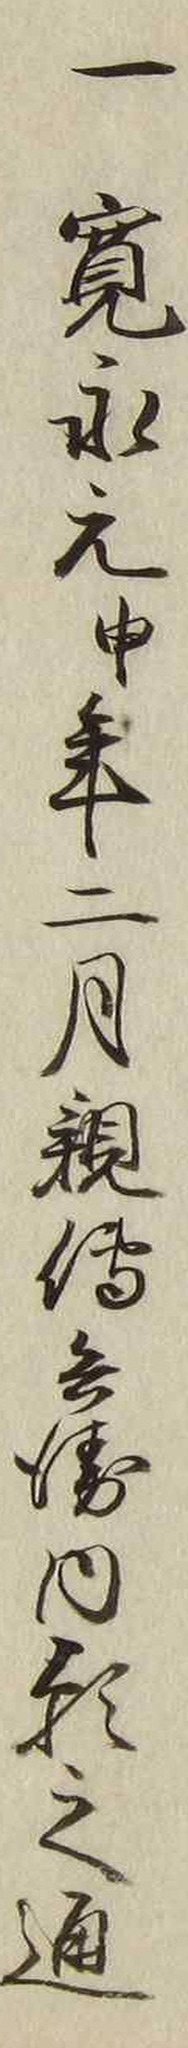一寛永元申年二月親伝兵衛内願之通
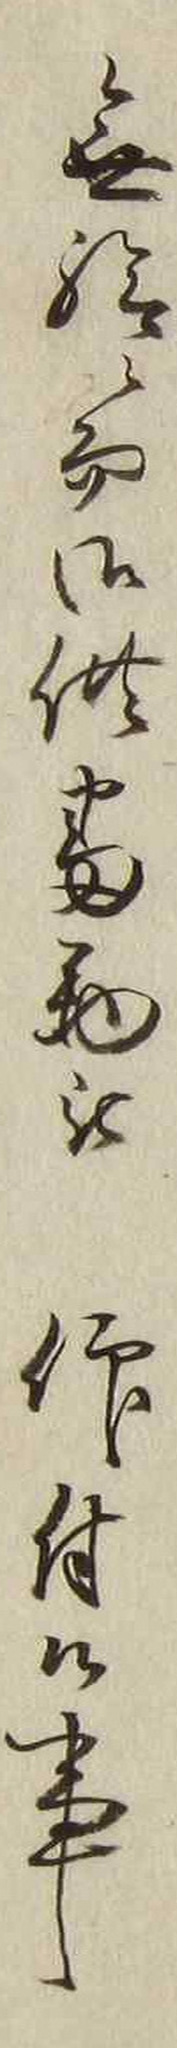無給ニ而御供番勤被仰付候事

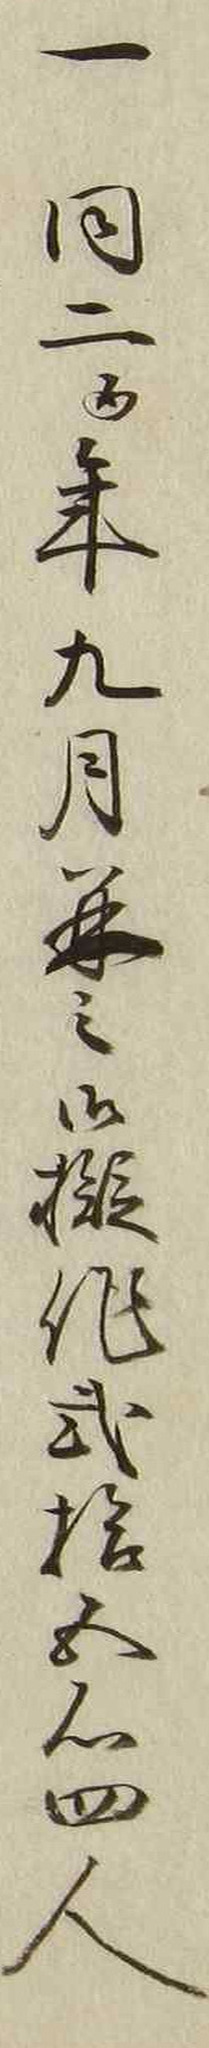一同二酉年九月再之御擬作弐拾五石四人
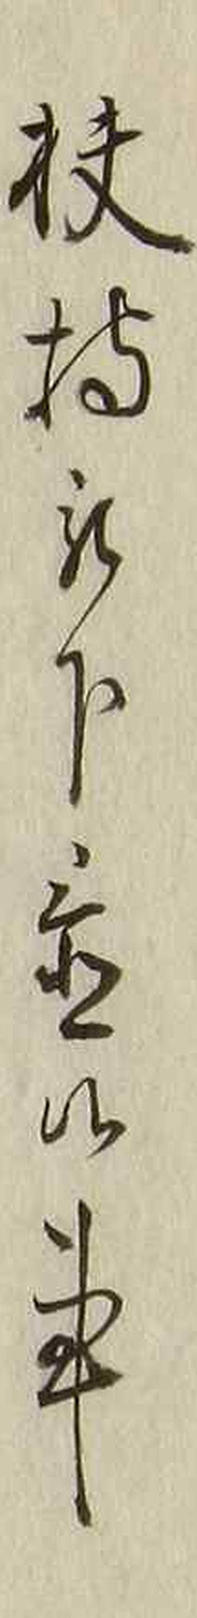扶持被下置候事
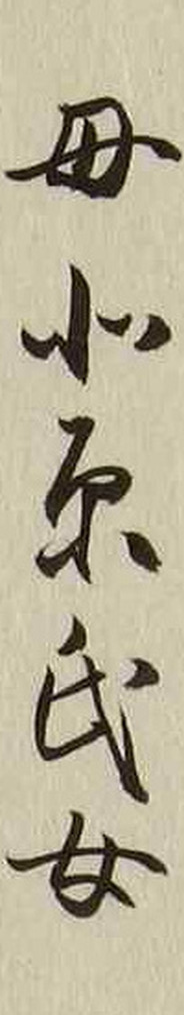母北原氏女
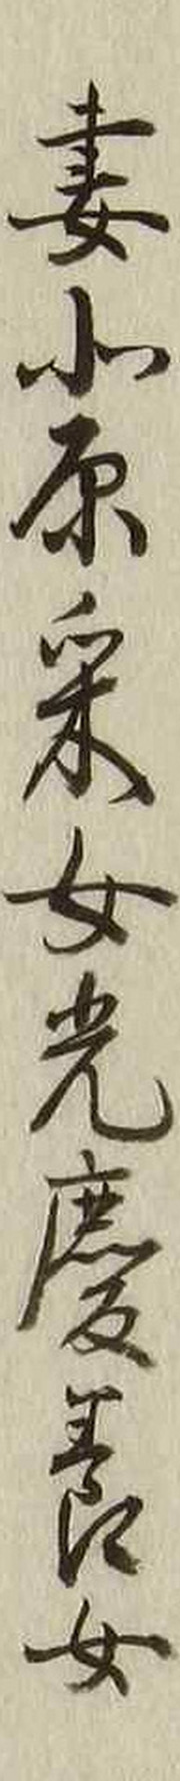妻北原采女光慶養女
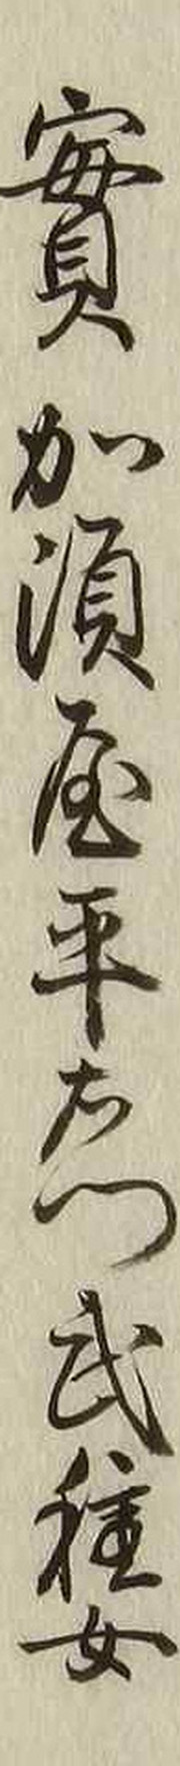実加須屋平右門武種女
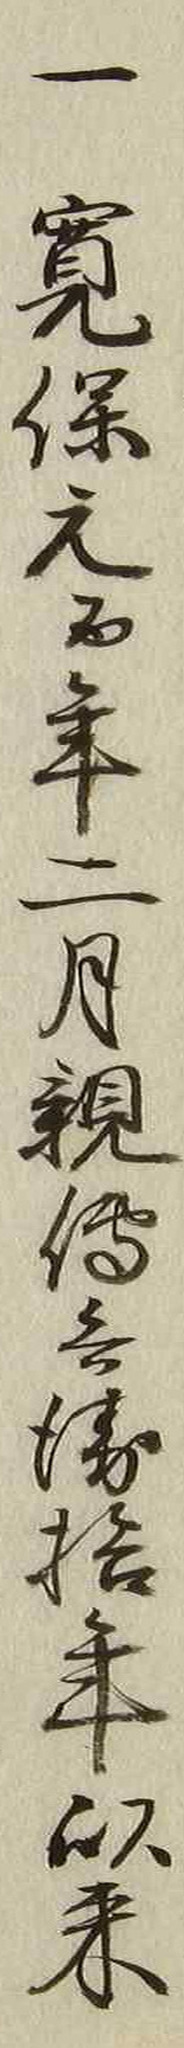一寛保元酉年二月親伝兵衛拾年以米
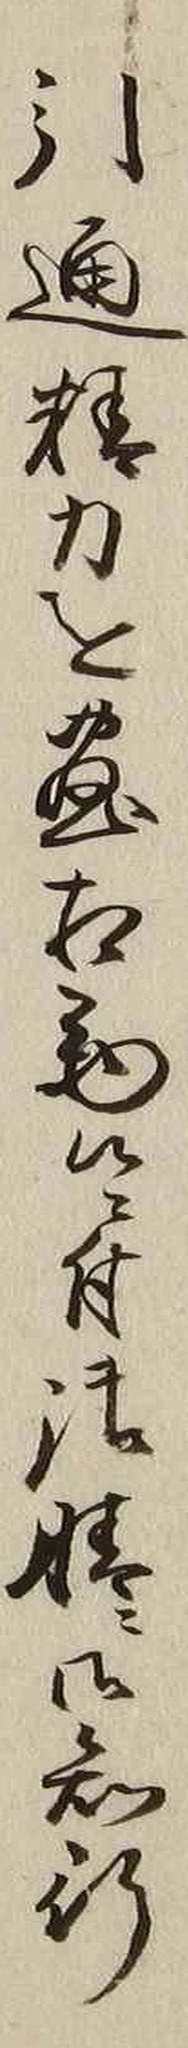引通精力を敷相勤候ニ付御情ニ御知行
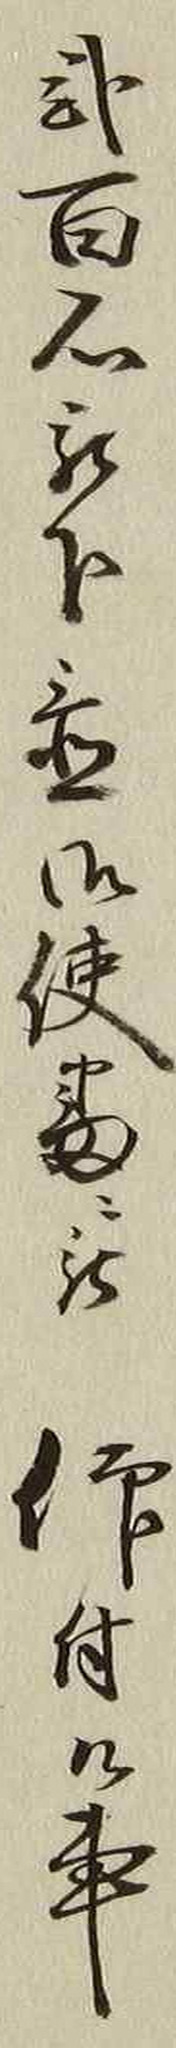弐百石被下置御使番ニ被仰付候事
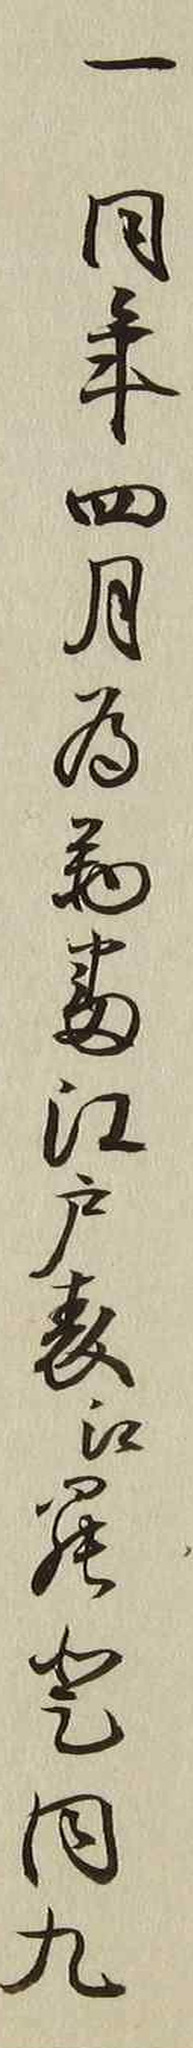一同年四月為勤番江戸表江罷登同九
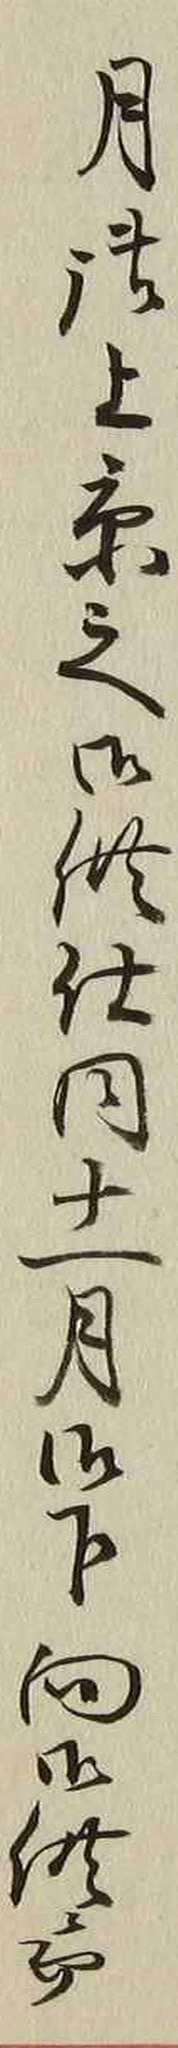月御上京之御供仕同十一月御下向御供ニ而
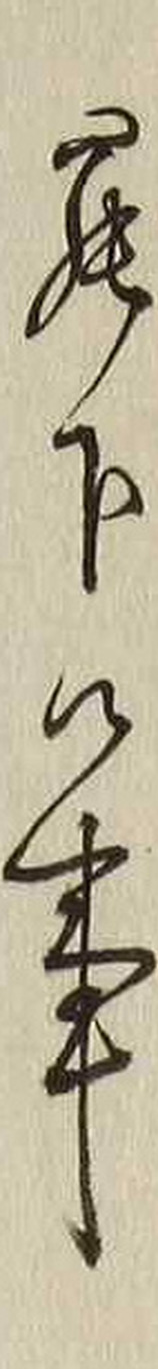罷下候事
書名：諸士系譜　巻之15　い之部15
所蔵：会津若松市立会津図書館
